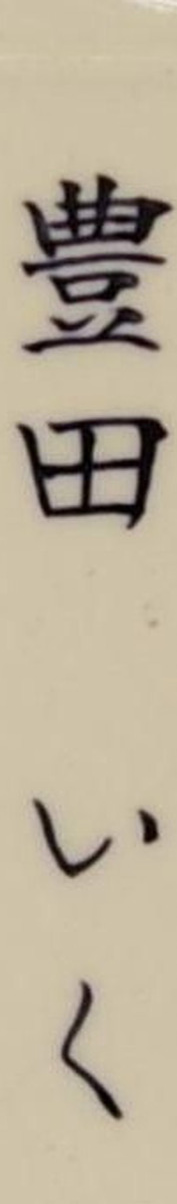豊田いく
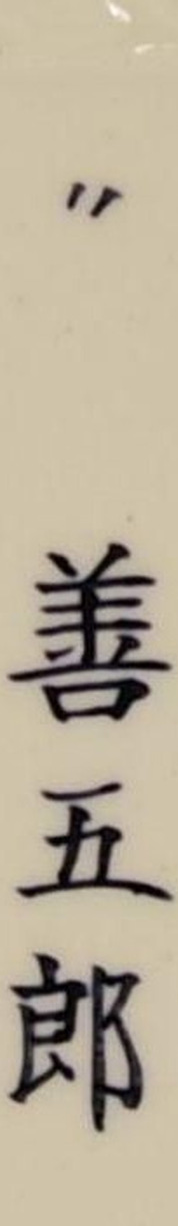善五郎
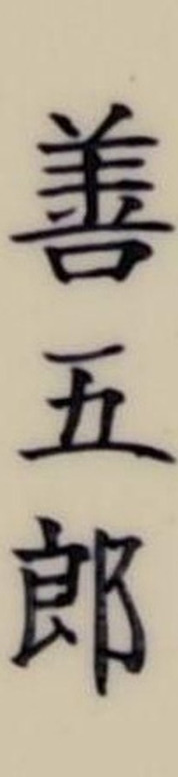善五郎
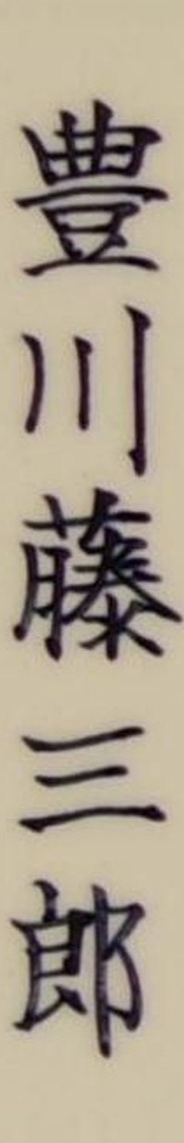豊川藤三郎
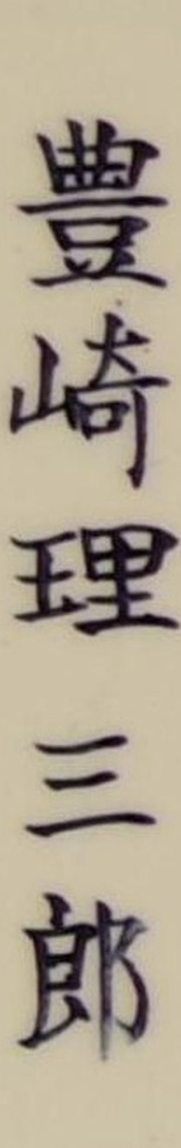豊崎理三郎
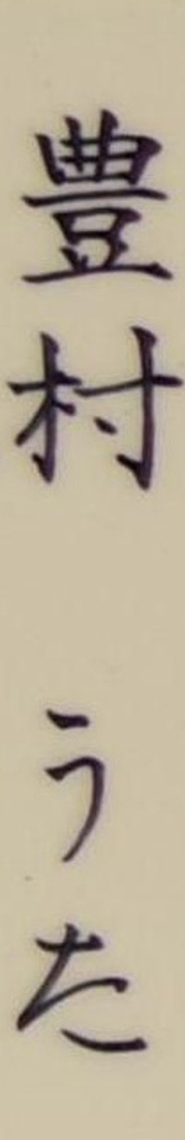豊村うた
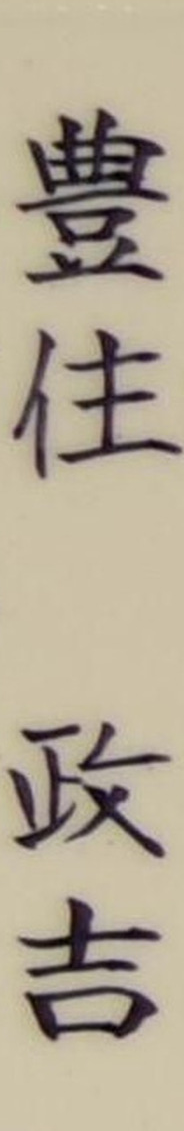豊住政吉
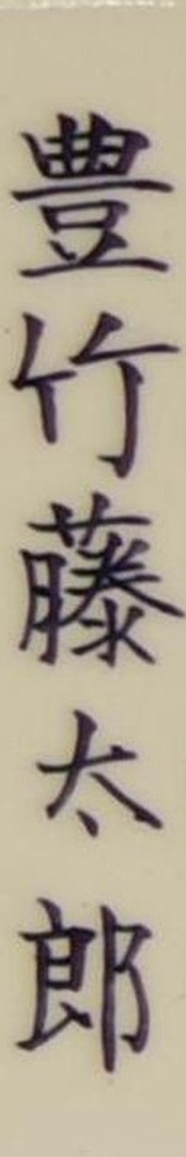豊竹藤太郎

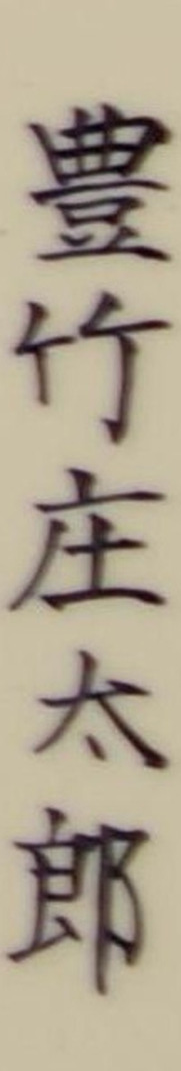豊竹庄太郎
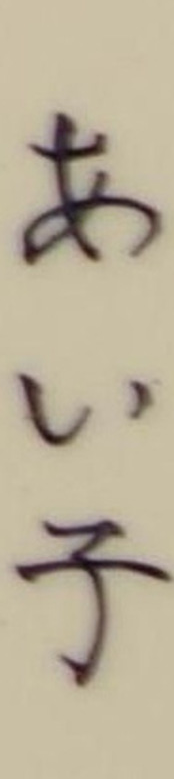あい子
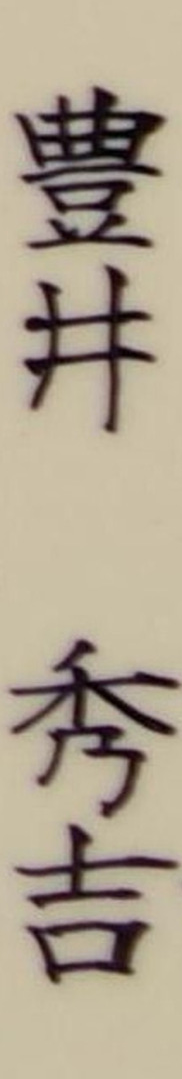豊井秀吉
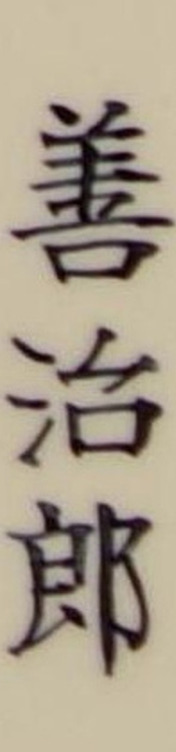善治郎
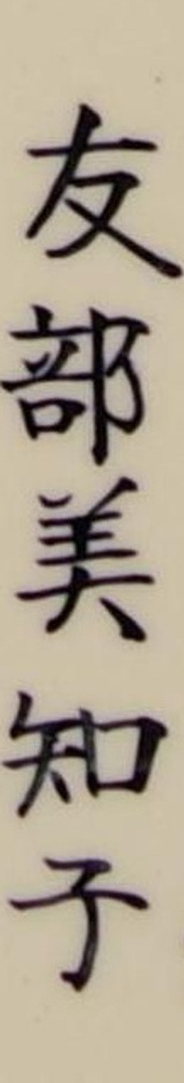友部美和子
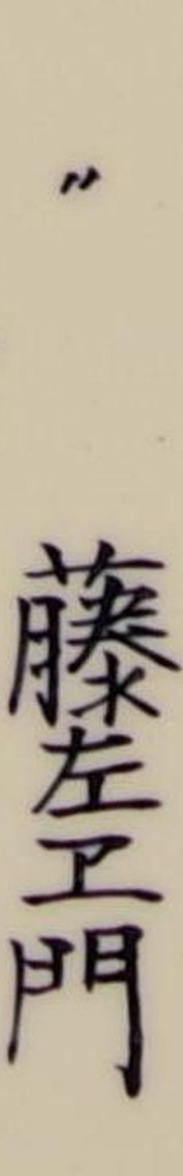藤左ヱ門
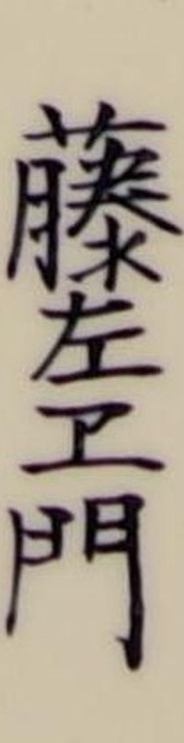藤左ヱ門
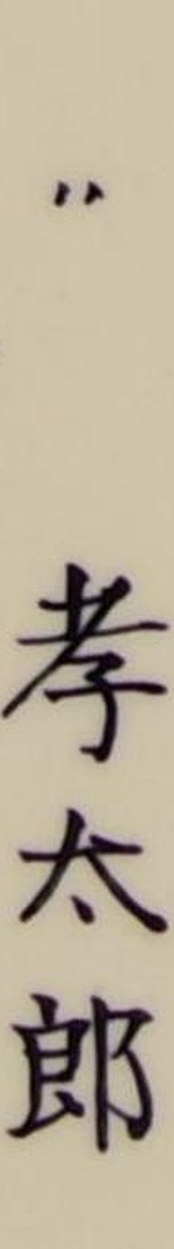孝太郎
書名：A~D
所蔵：koyasan kongobuji
